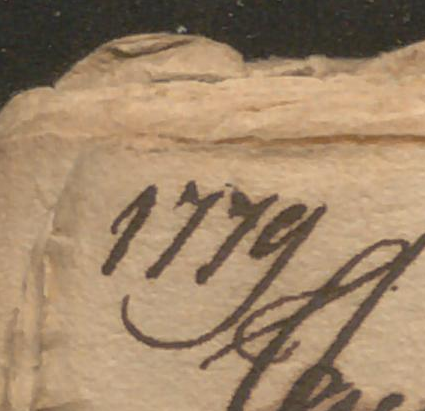1779
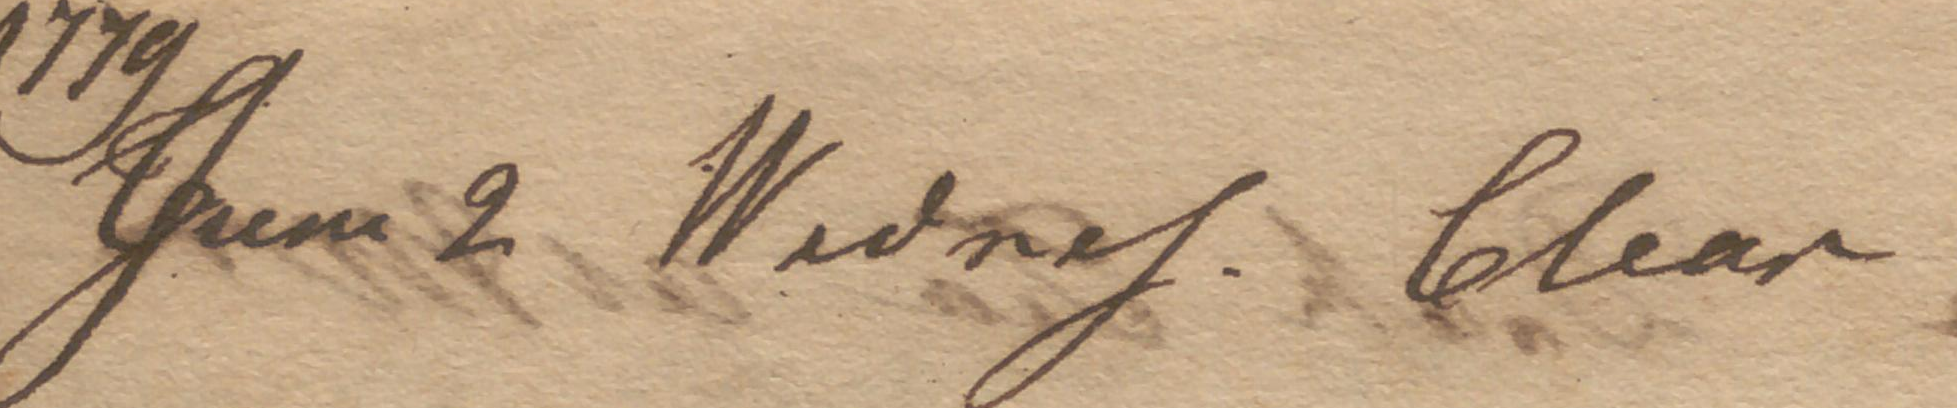June 2 Wednes. Clear
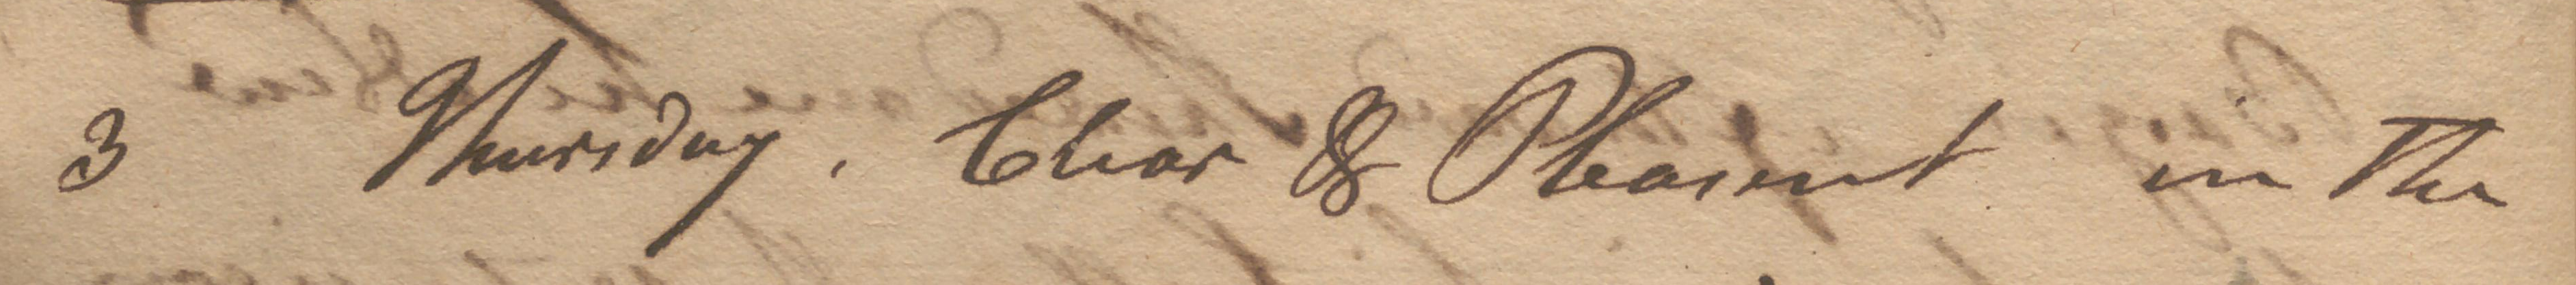3 Thursday. Clear & Pleasent in the
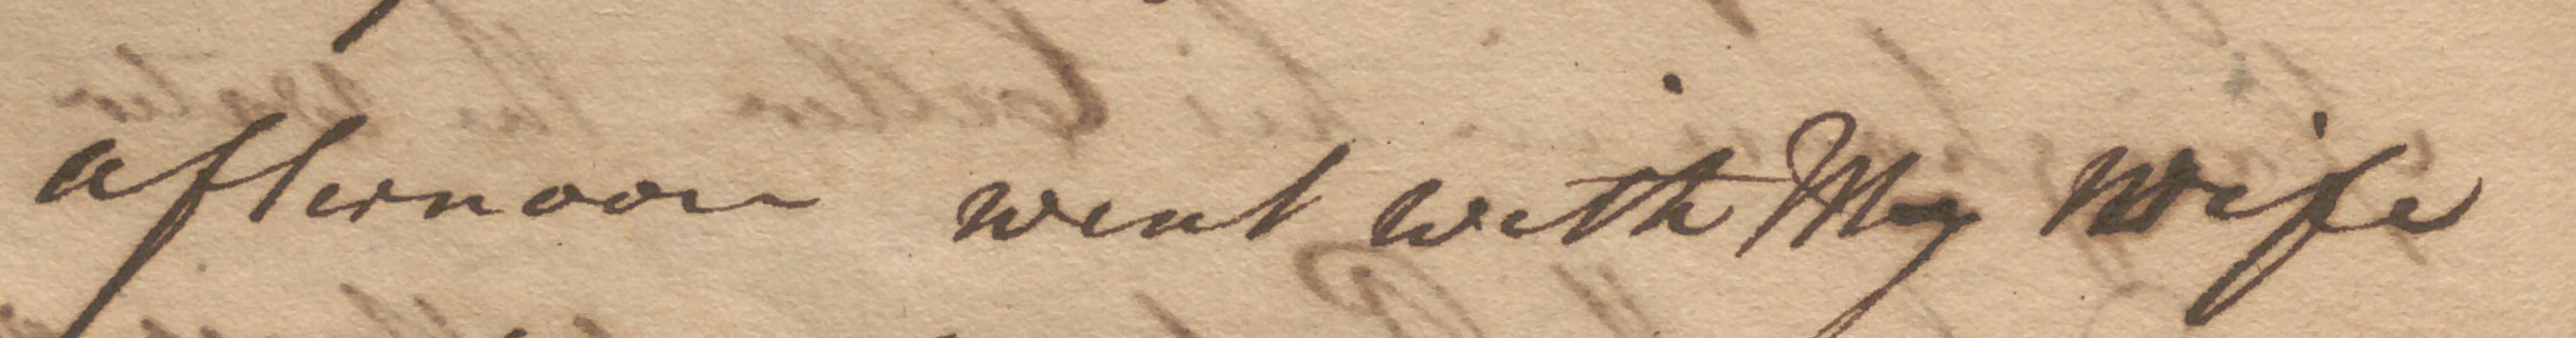afternoon went with My wife
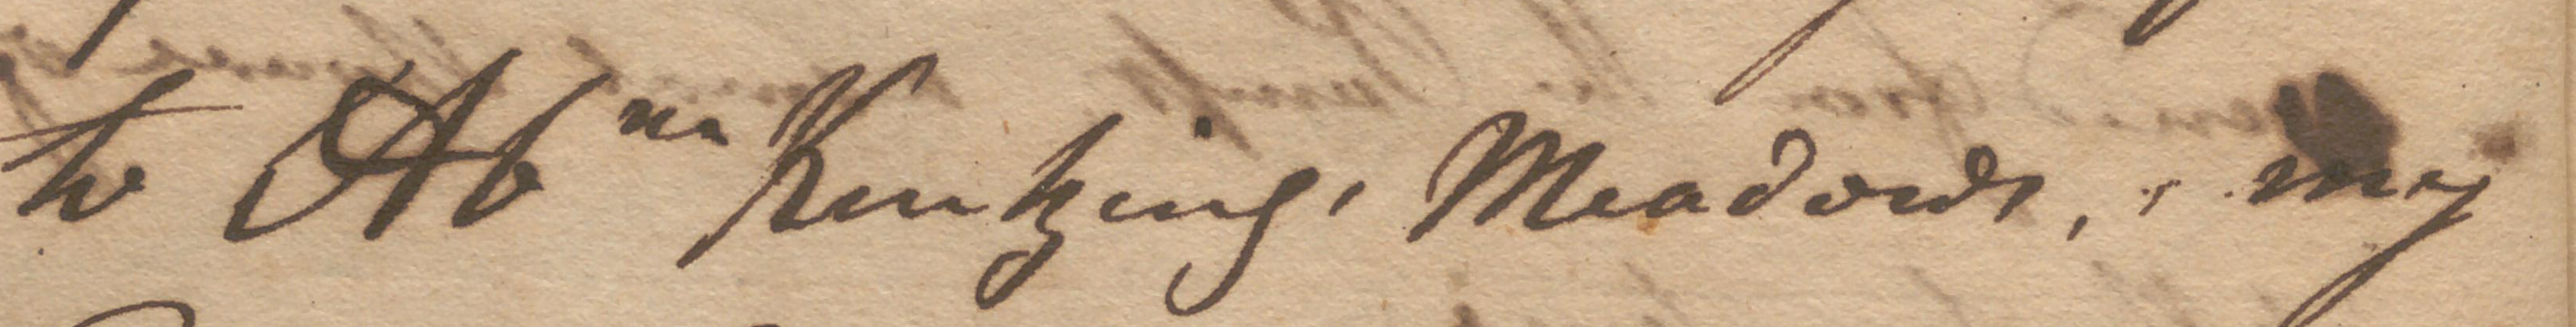t Ab^m Kintzing Meadows, my
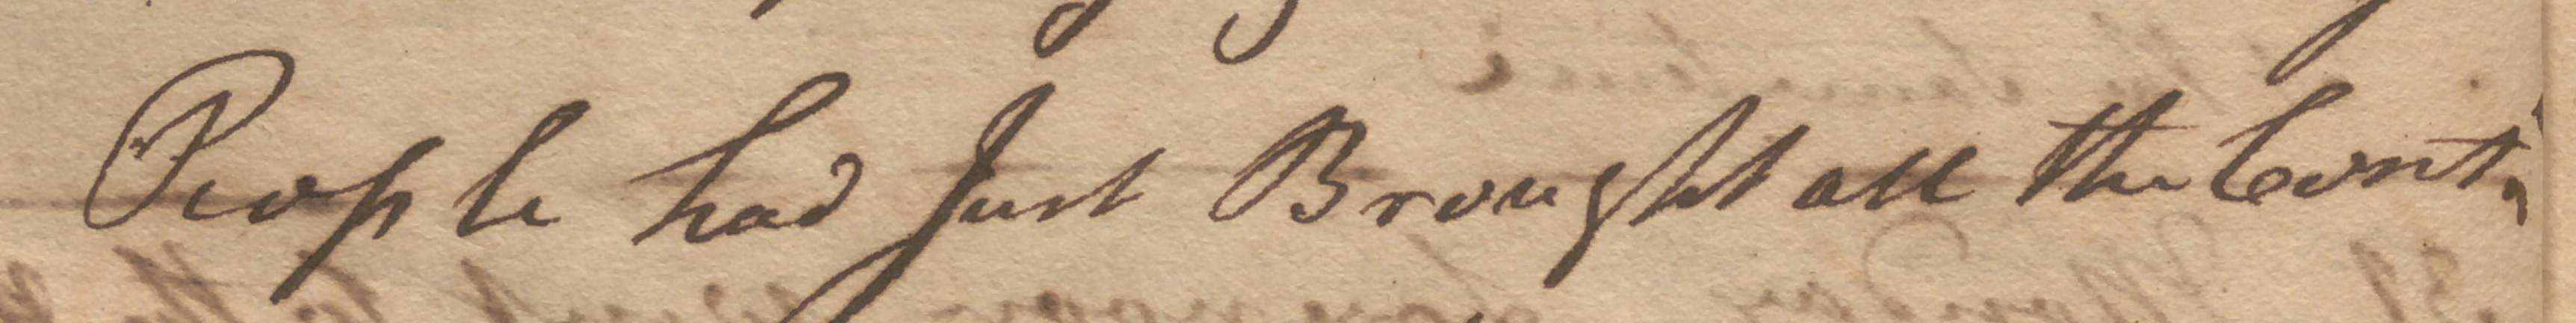People had Jurt Brought all the Cont
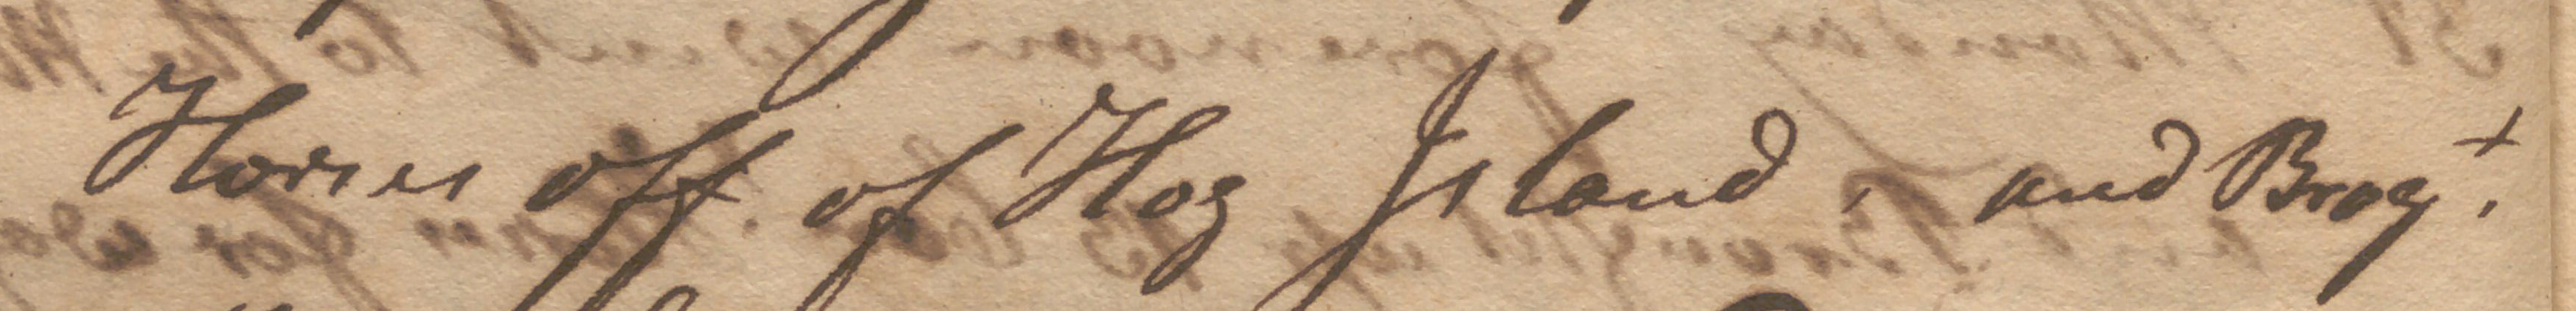Horses off of Hog Island, and Brog^t.
